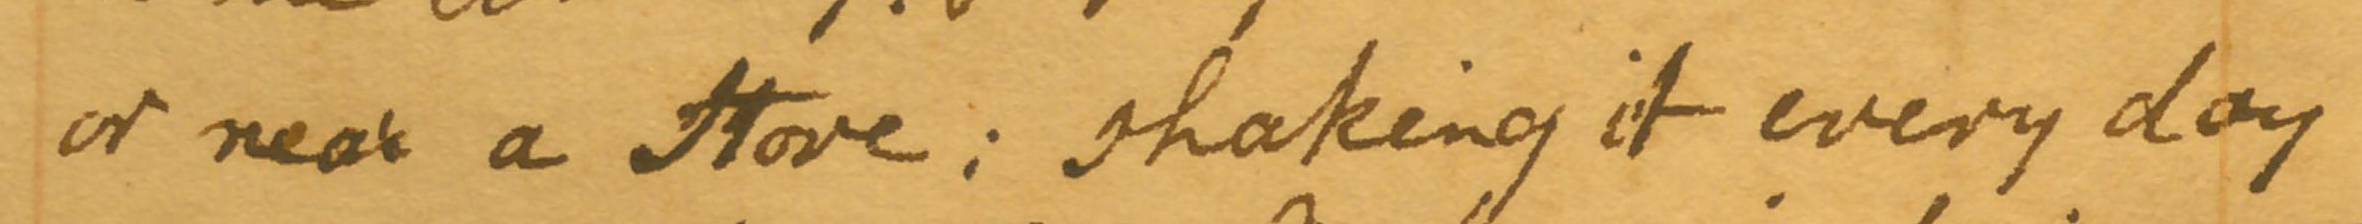or near a Stove; shakeing it every day
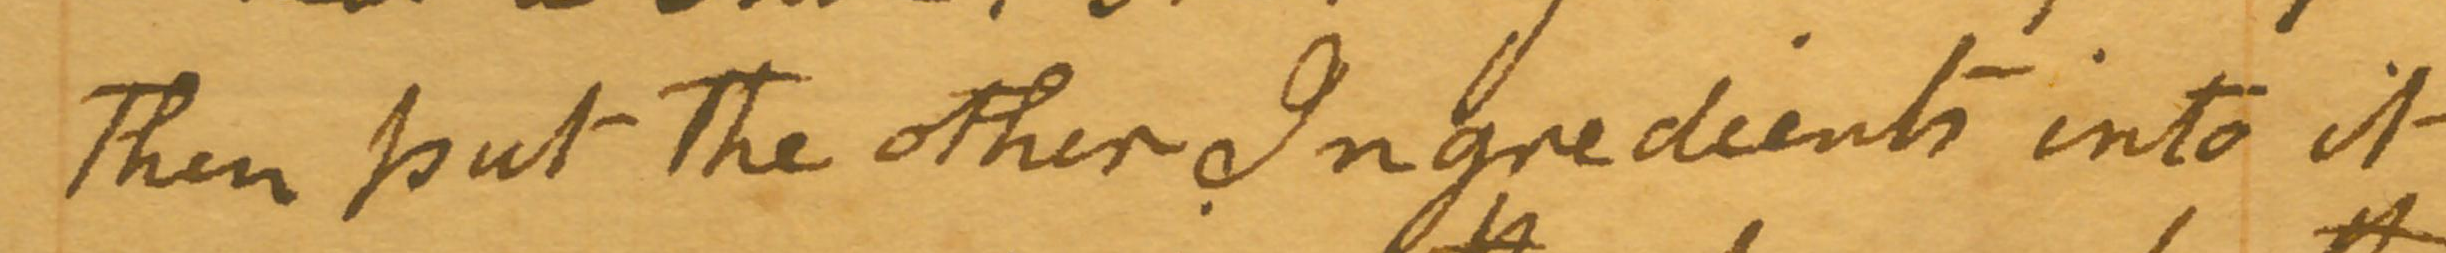Then put the other Ingredients into it
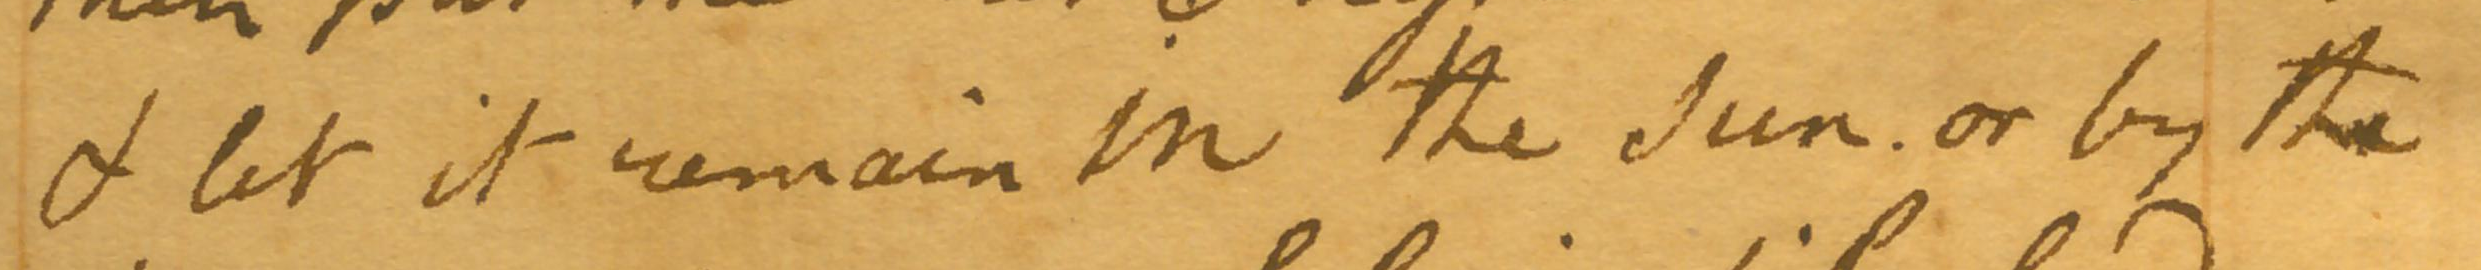& let it remain in the sun or by the
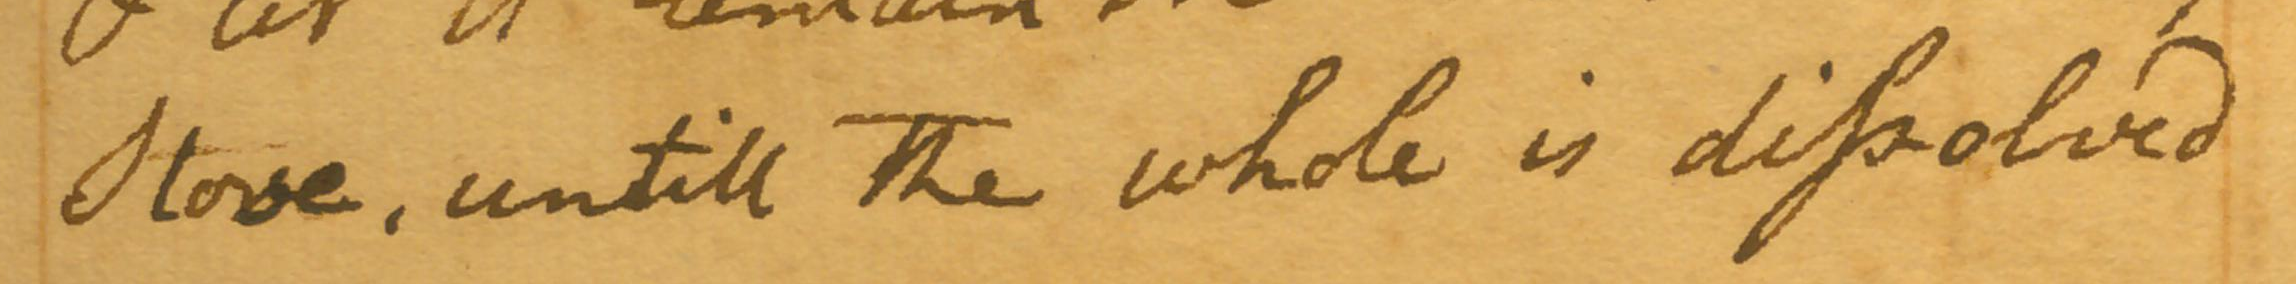stove, until the whole is dissolved
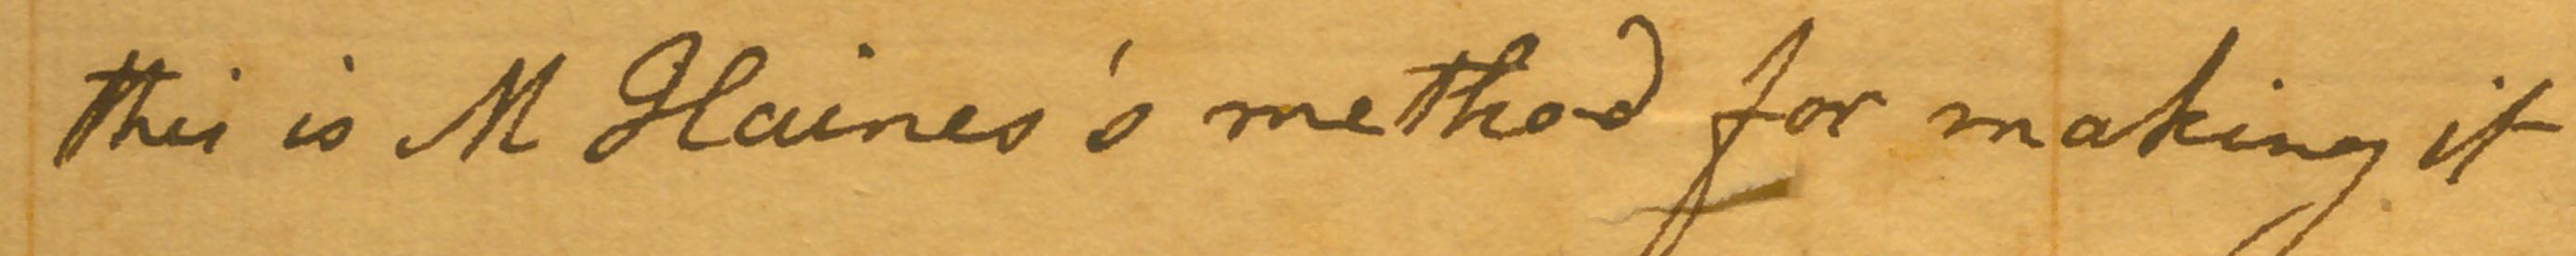this is M Haines's method for making it
